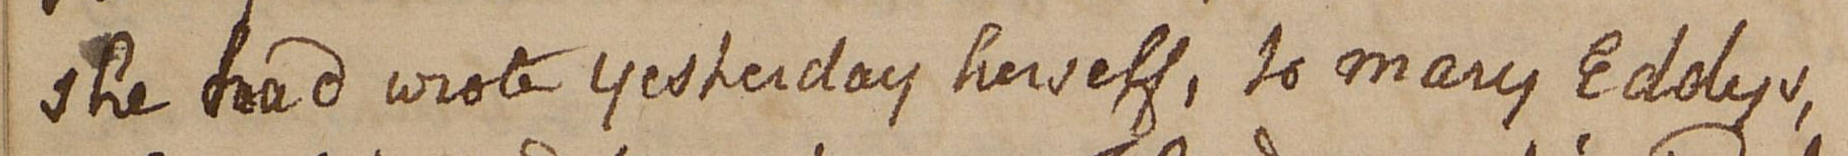she had wrote yesterday herself, to Mary Eddys,
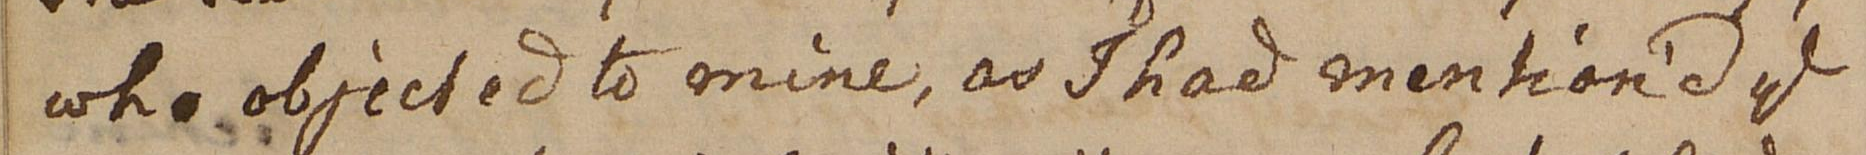who objected to mine, as I had mention'd y^e
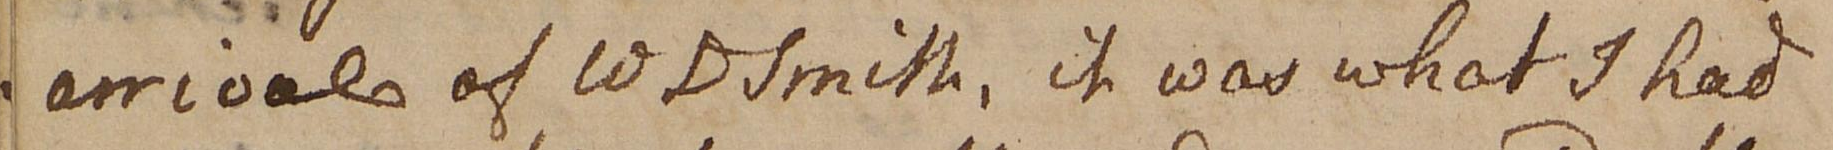arrival of W D Smith, it was what I had
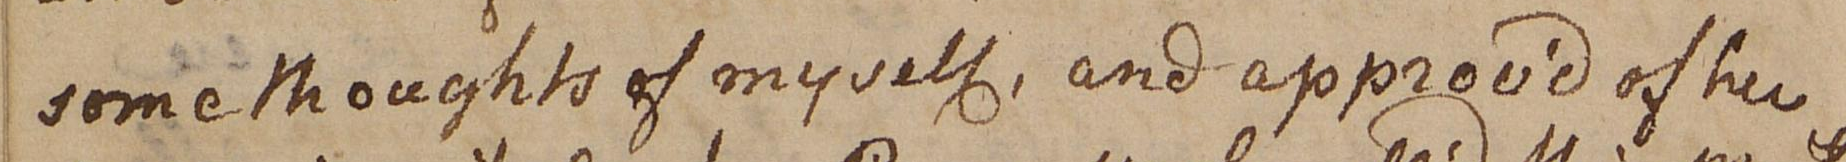some thoughts of myself, and approv'd of her
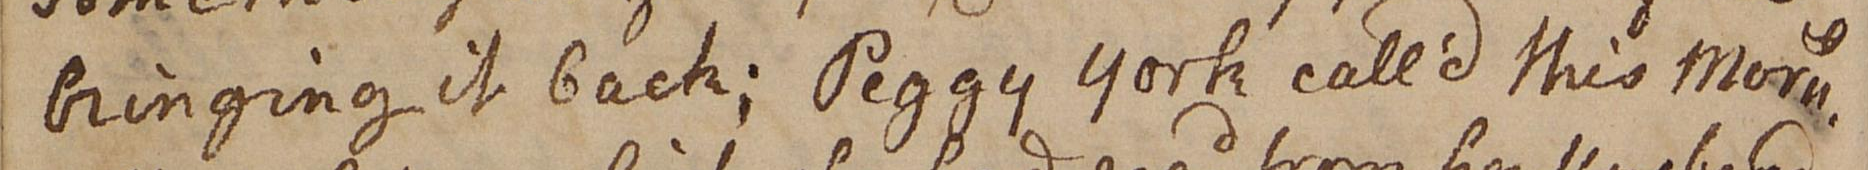bringing it back; Peggy York call'd this Morn^g.
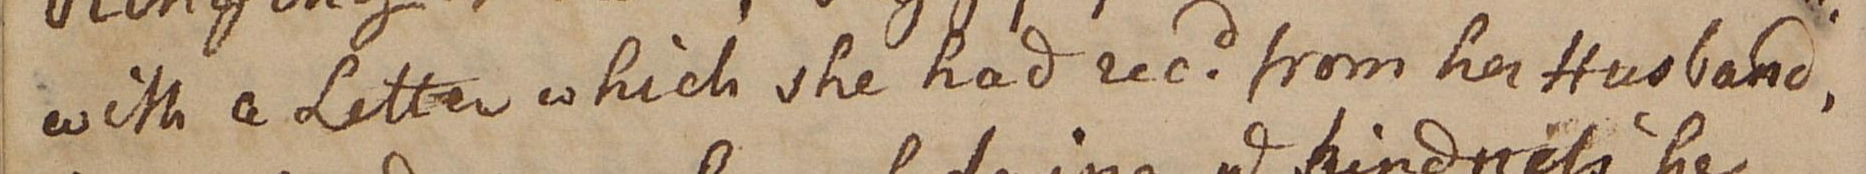with a Letter which she had rec^d. from her Husband,
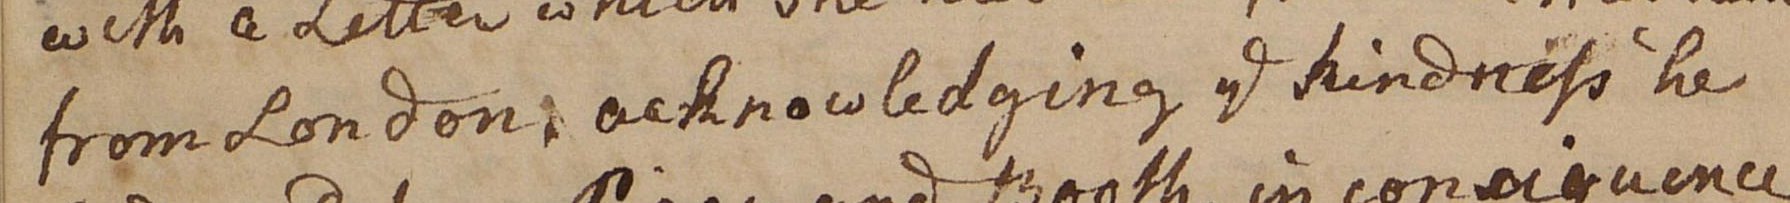from London, acknowledging y^e kindness he
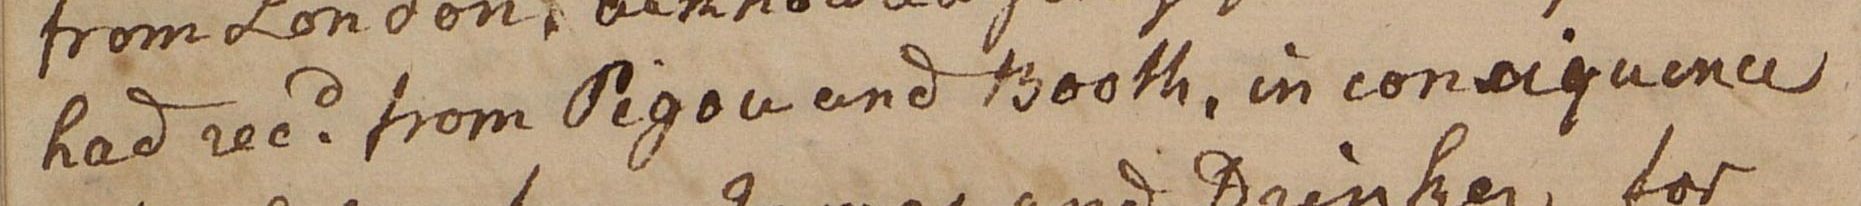had rec^d. from Pegou and Booth, in consiquence
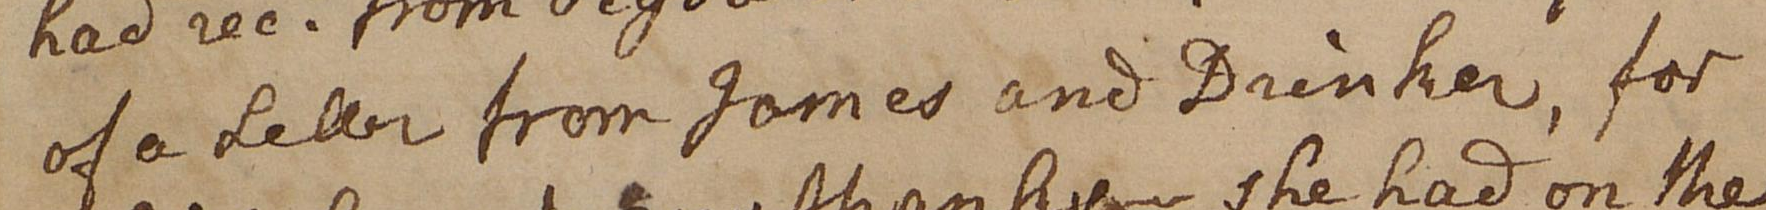of a Letter from James and Drinker, for
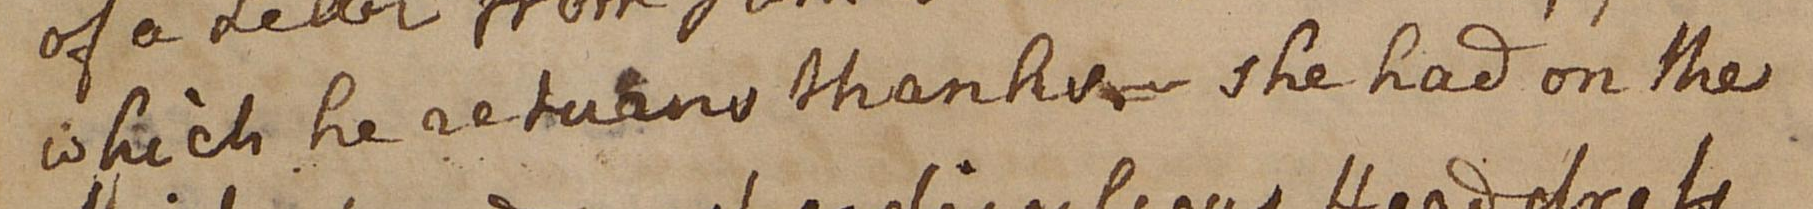which he returns thanks- she had on the
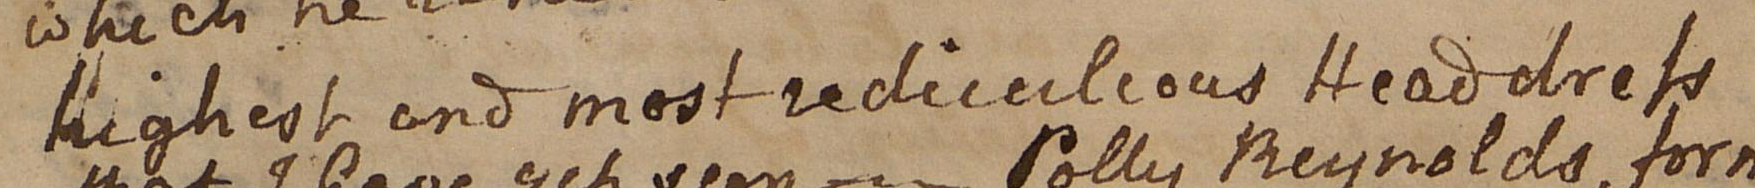highest and most rediculeous Headdress
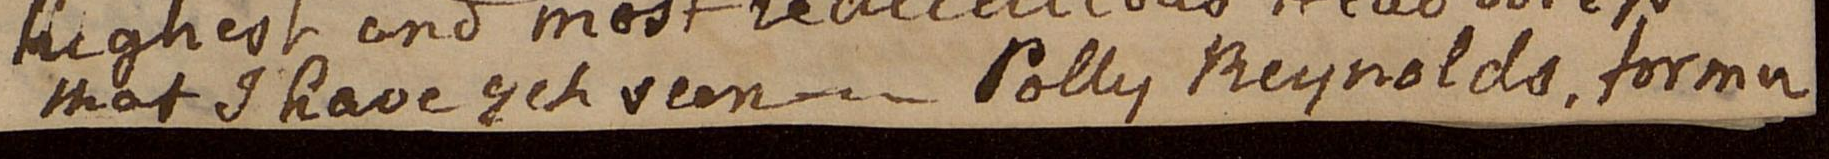that I have yet seen- Polly Reynolds, former
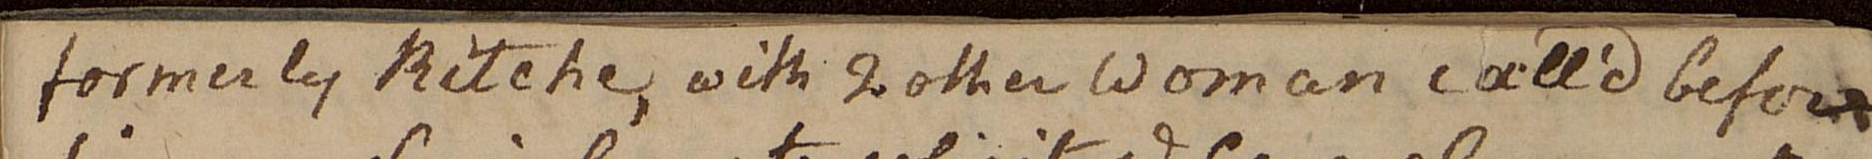formerly Ritche, with 2 other Woman call'd before
